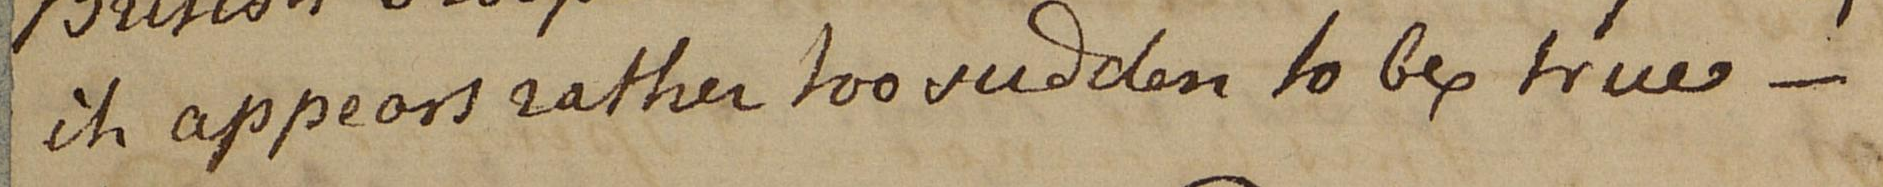it appears rather too sudden to be true-
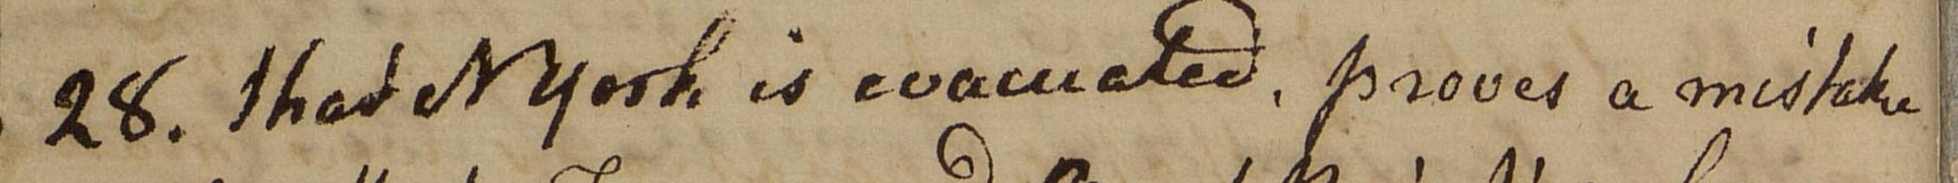28. that N York is evacuated, proves a mistake
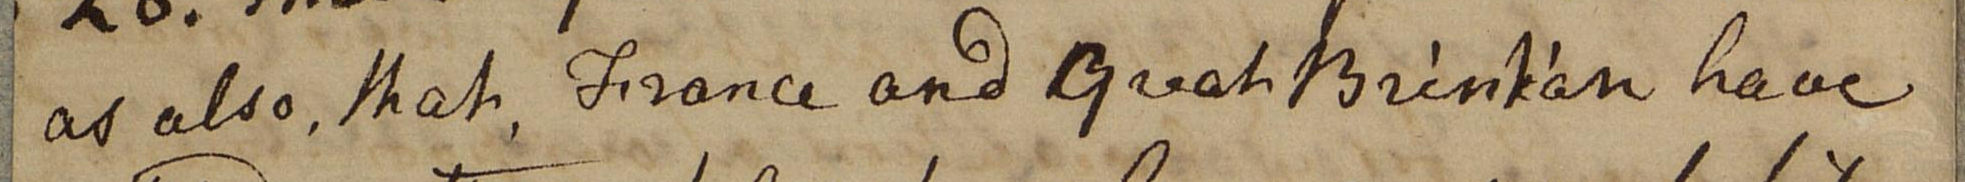as also, that, France and Great Brintian have
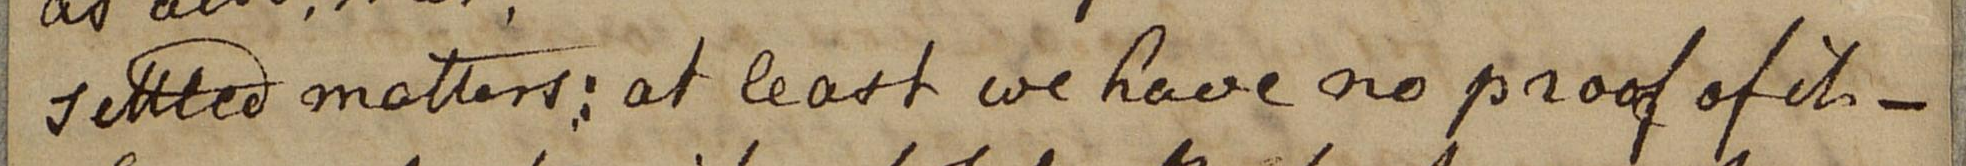settled matters: at least we have no proof of it-
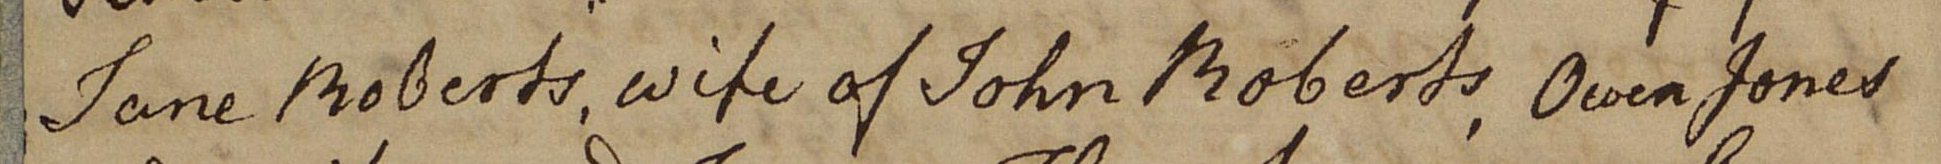Jane Roberts, wife of John Roberts, Owen Jones
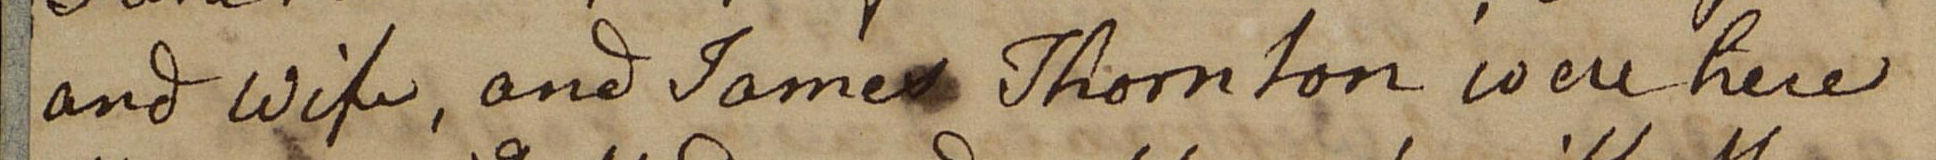and wife, and I James Thornton were here
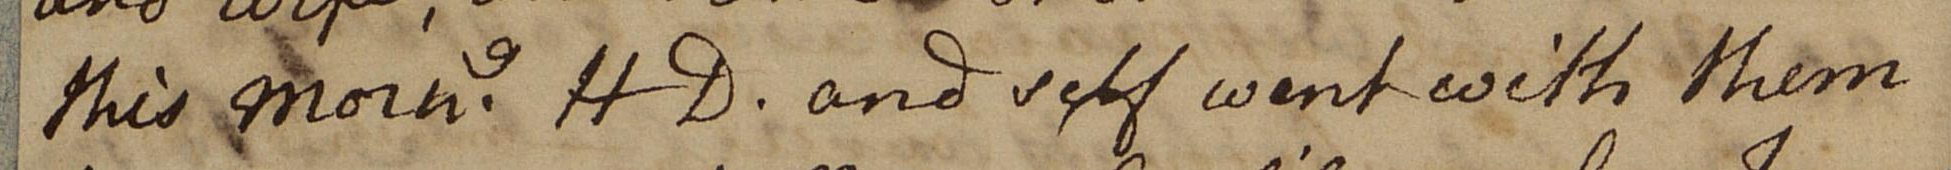this morn^g. HD. and self went with them
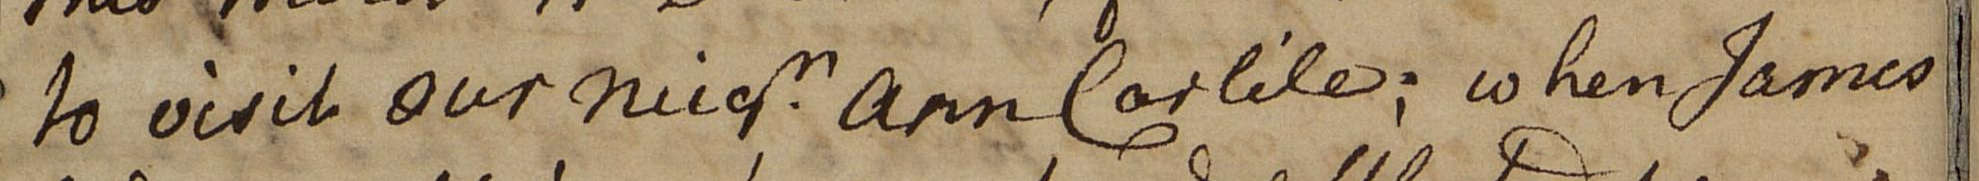to visit our Neigh^r. Ann Carlile; when James
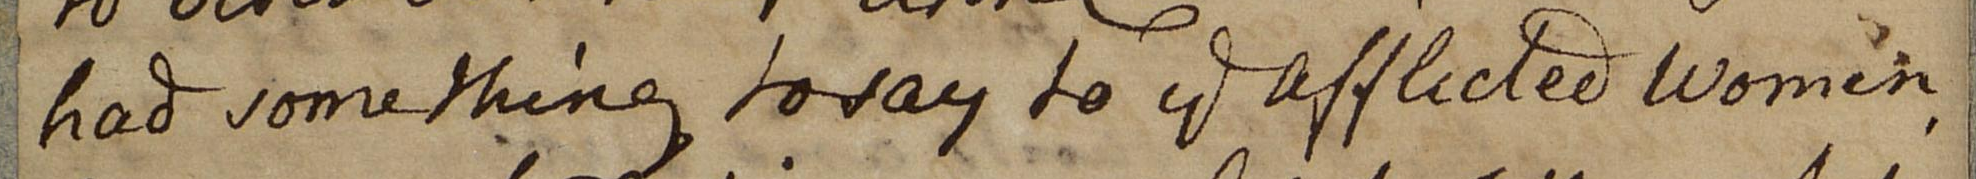had some thing to say to y^e afflicted women,
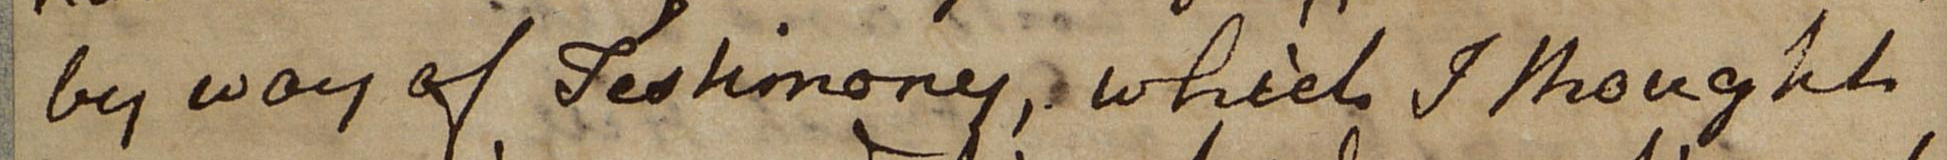be way of Testimony, which I thought
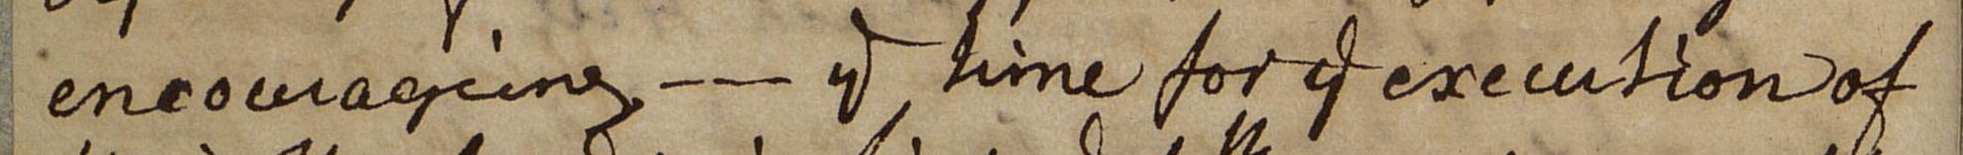encouraging-- y^e time for y^e execution of
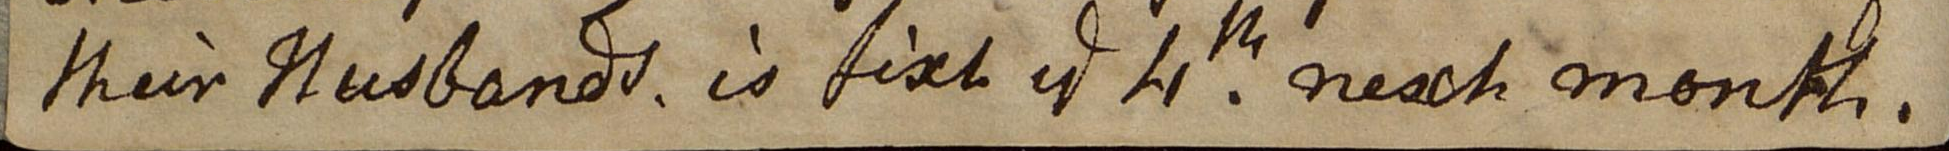their Husbands. is fixt y^e 4^th. next month.
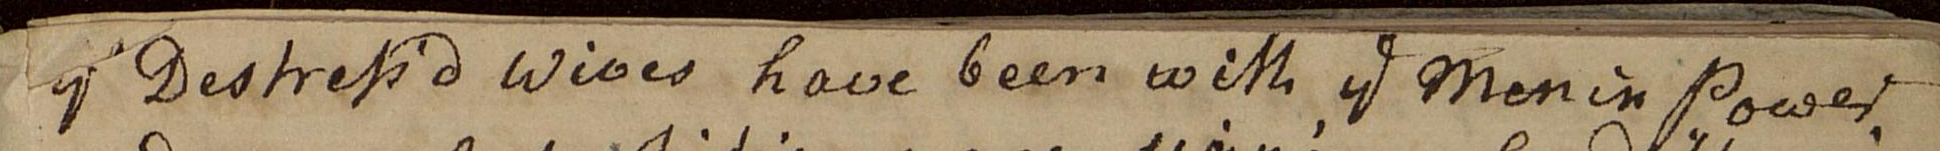y^e Destres'd Wives have been with y^e Men in Power,
